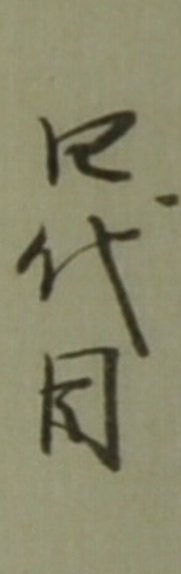四代目

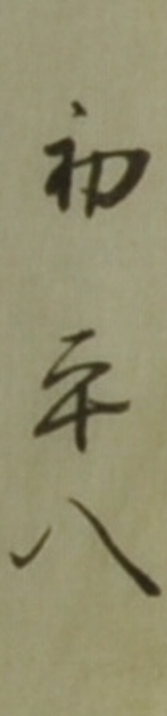初平八
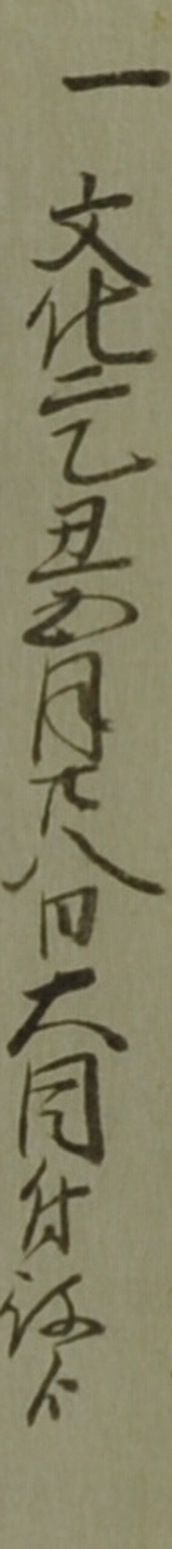一文化二乙丑五月廿八日大目付役ゟ
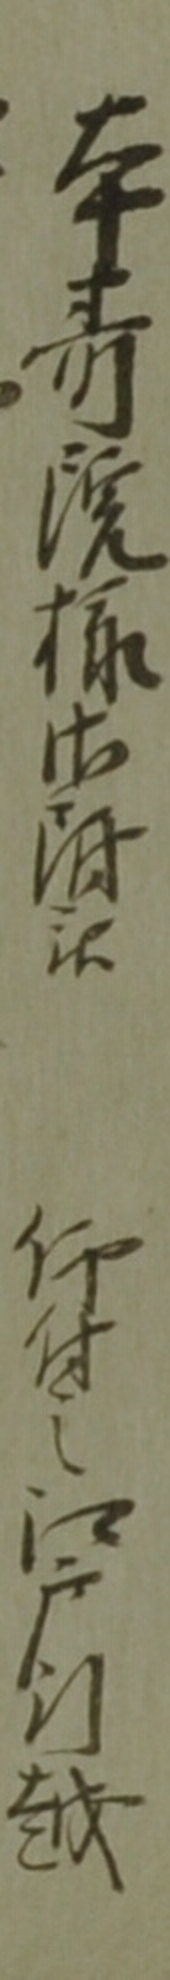本寿院様御附被仰付之江戸引越
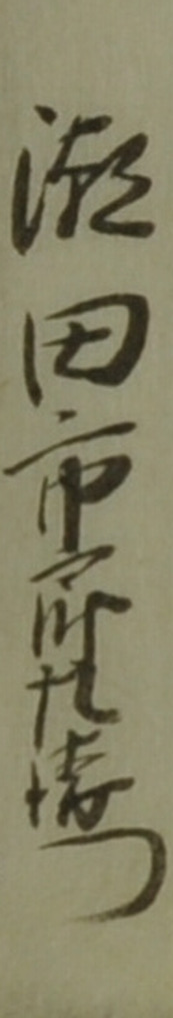瀬田市郎左衛門
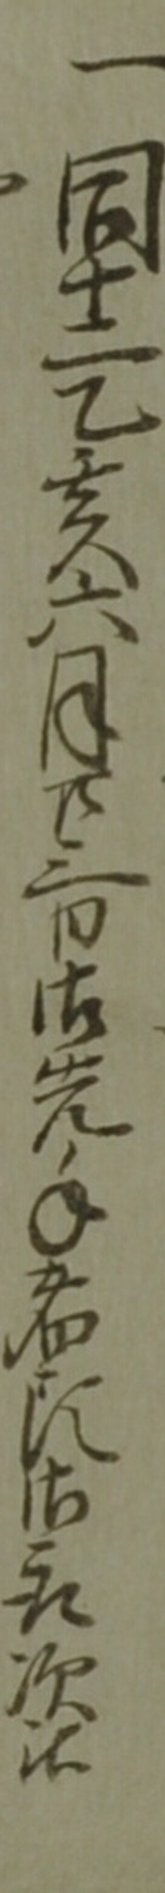一同十二乙亥六月廿三日御先手者頭御取次被
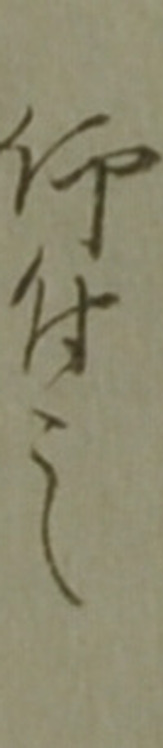仰付之
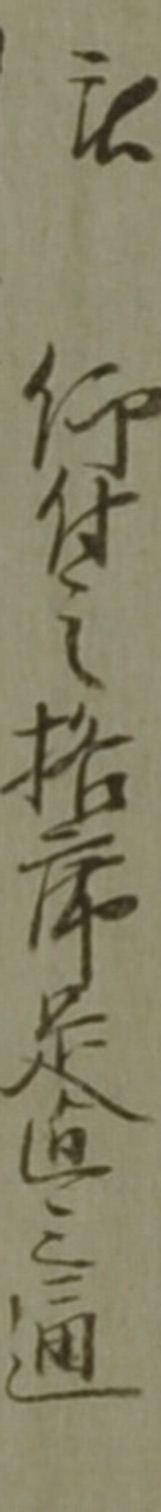被仰付之格席是迄之通
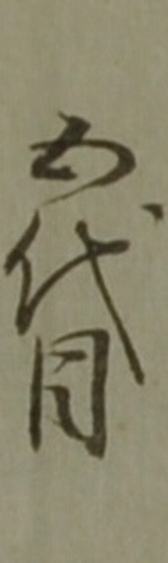五代目
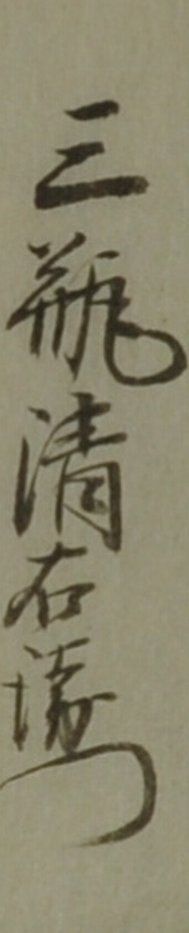三瓶清右衛門
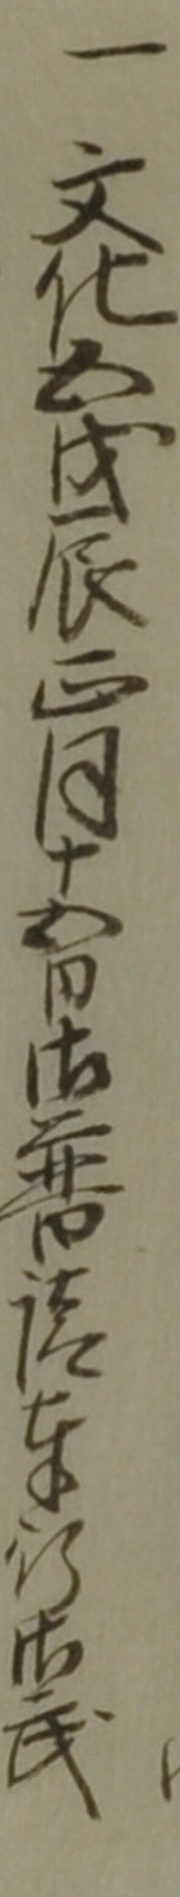一文化五戊辰正月十五日御普請奉行御武
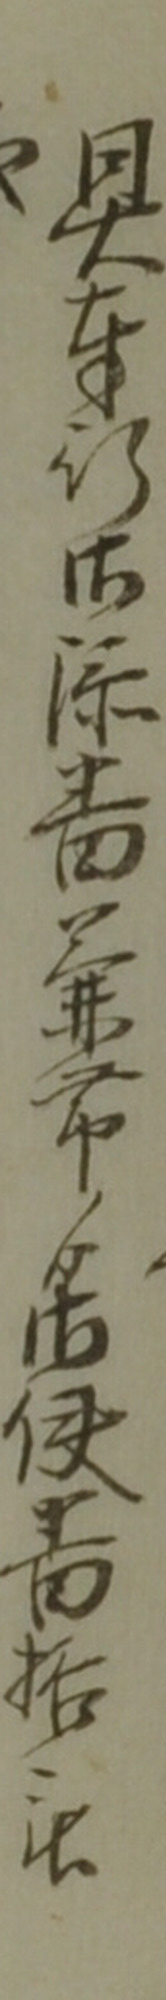具奉行御添番兼帯ゟ御使番格被
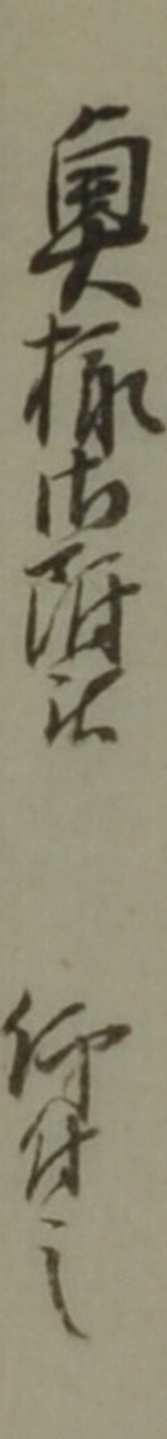奥様御附被仰付之
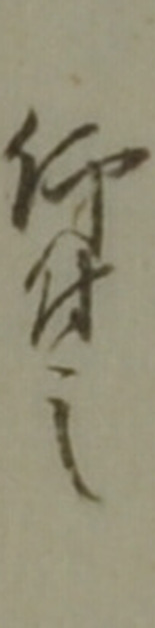仰付之
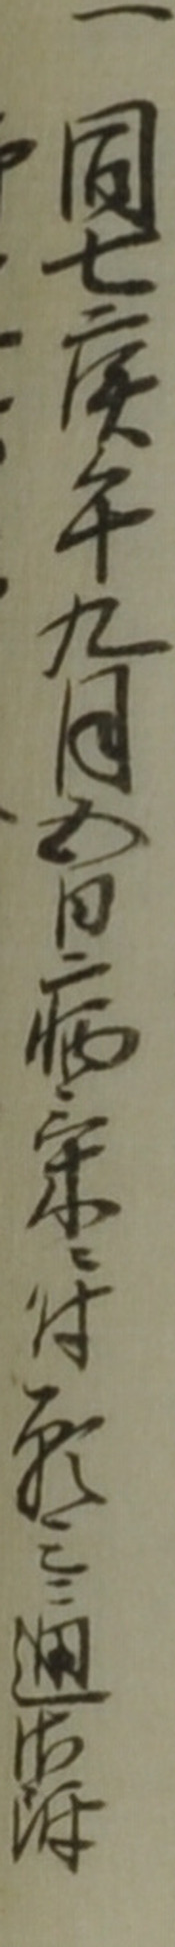一同七庚午九月五日病気ニ付願之通御附
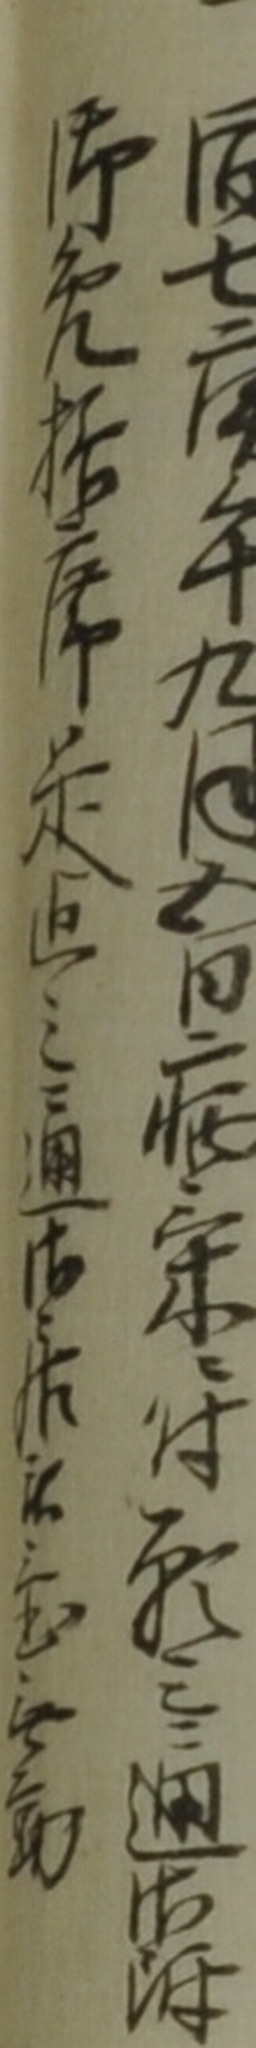御免格席是迄之通御居被置無勤
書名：諸御役代々録（六）
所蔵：伊那市立高遠町図書館・合同会社AMANE
